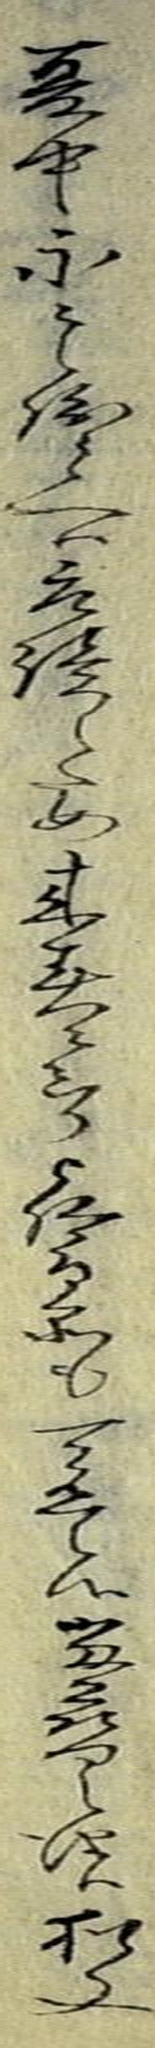夏中永々之儀ニ候ヘハ取続之ため来春ニ至り被仰付品も可有之候当暮之儀ハ猶又
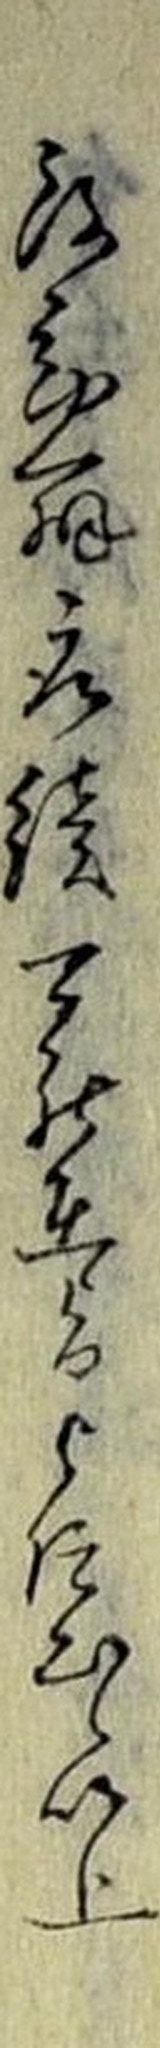致勘弁取続可罷在旨被仰出候以上
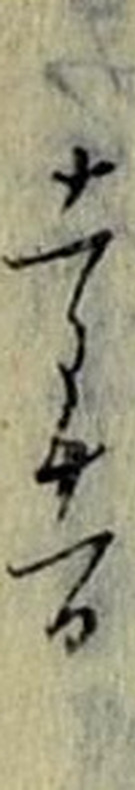十一月十一日
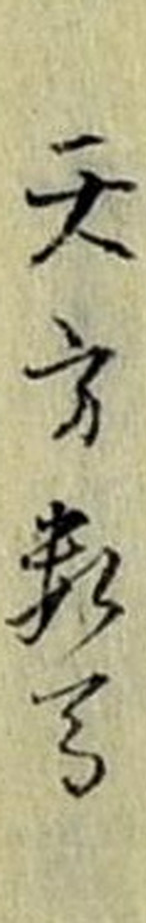天方数馬
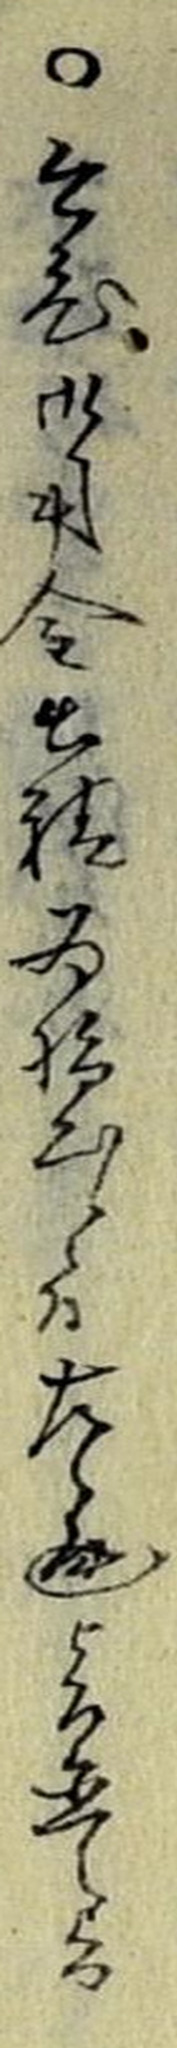〇今度御用金出精為指出候ニ付左之通被下置之旨
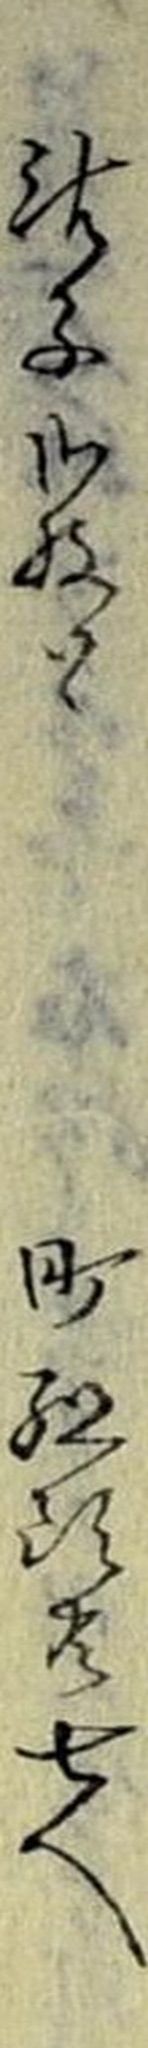銀子弐枚ツヽ町組頭共七人
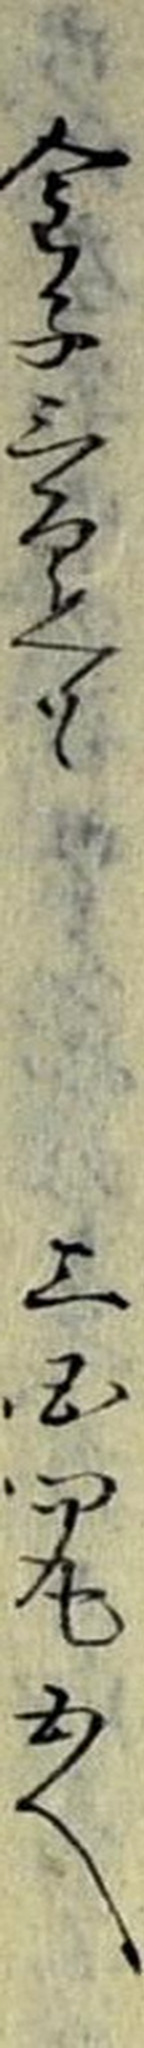金子三百疋ツヽ三国問丸五人
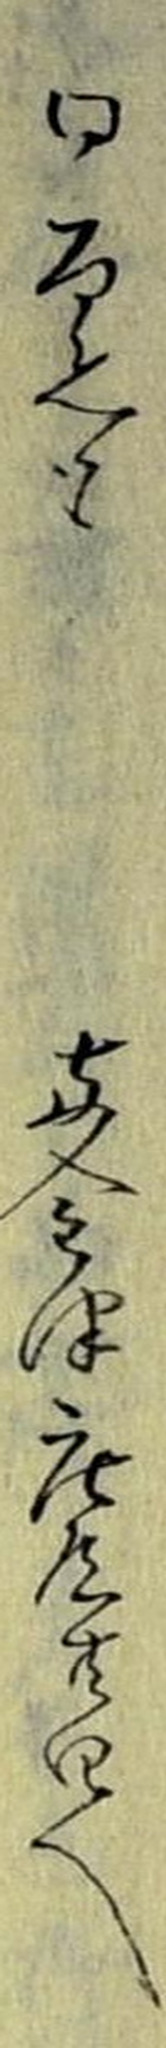同百疋ツヽ両金津庄屋共四人
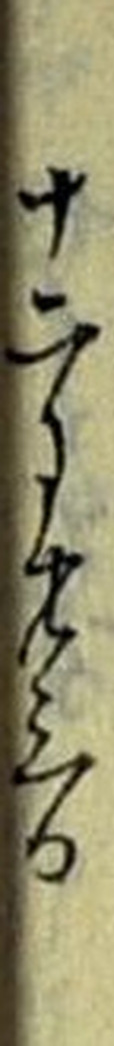十二月廿三日
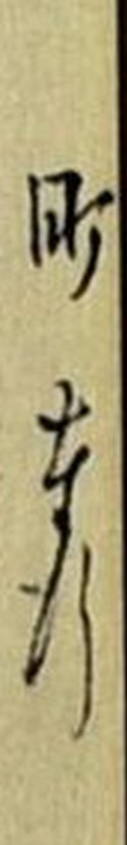町奉行
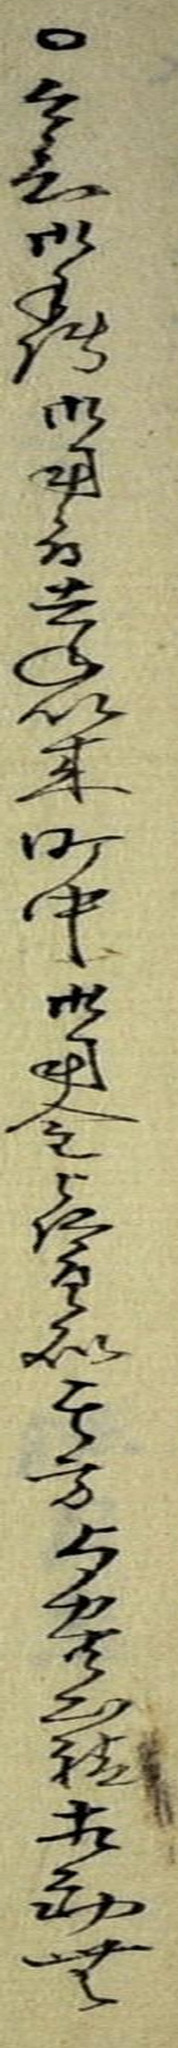〇今度御手伝御用ニ付去年以来町中御用金被仰付候処其方与力共出精相勤無
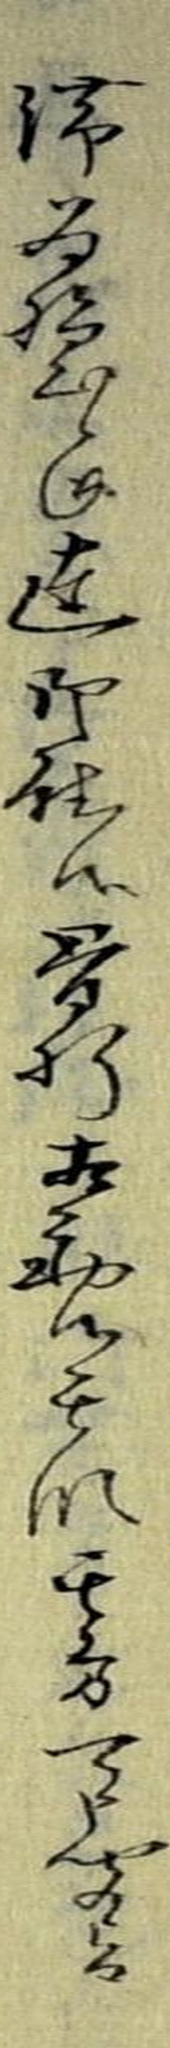滞為指出候趣達御聴候骨折相勤候其段其方可申聞旨
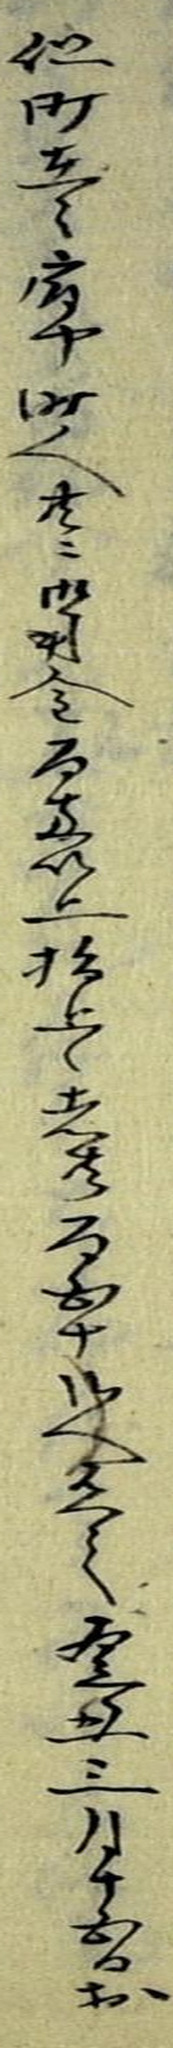但町在々府中町人共ニ御用金百両以上指上候者共百五十弐人有之翌丑三月十五日於
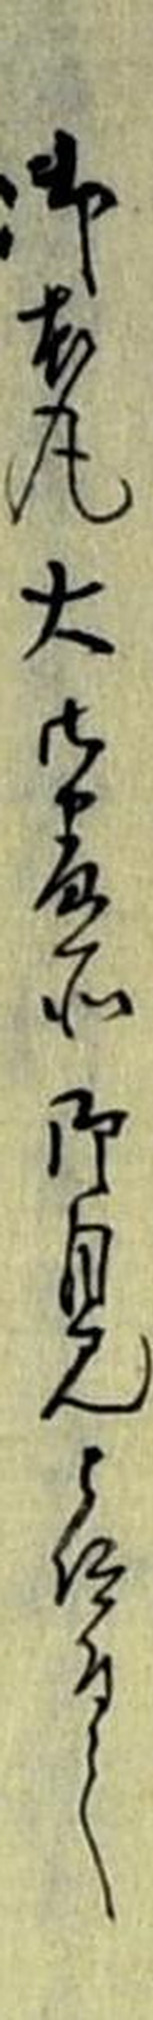御本丸大御番所御目見被仰付之

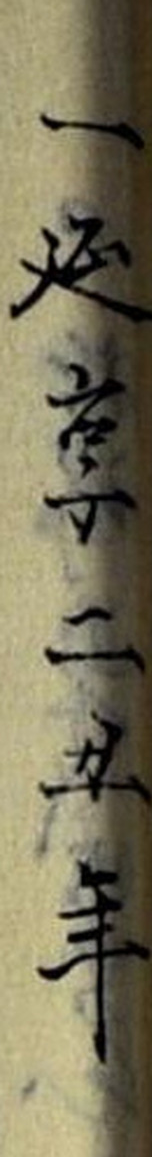一延享二丑年
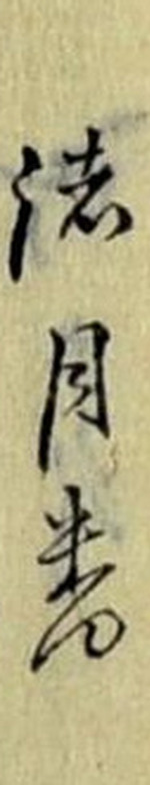諸月番
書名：命令之部 一
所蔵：福井県文書館 Fukui Prefectural Archives
